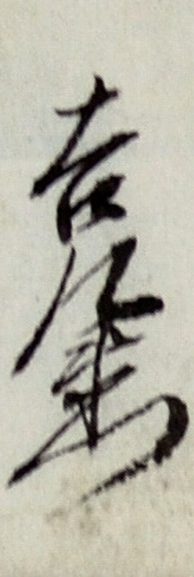杢左衛門
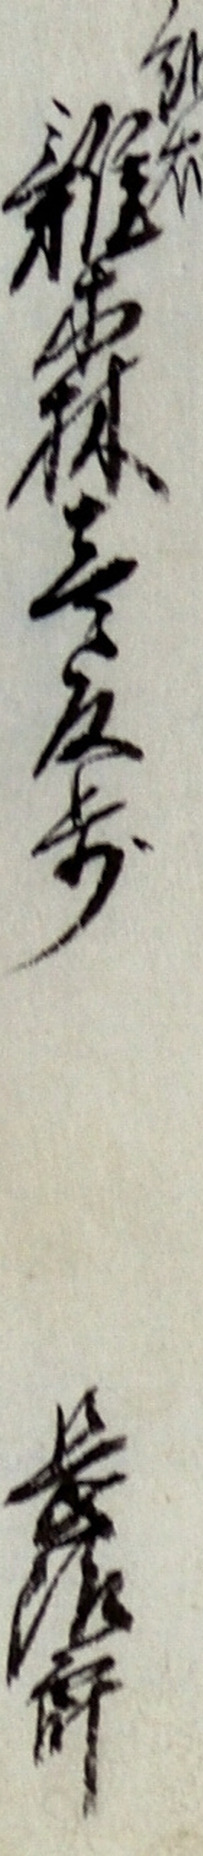雑木林壱反歩長治郎

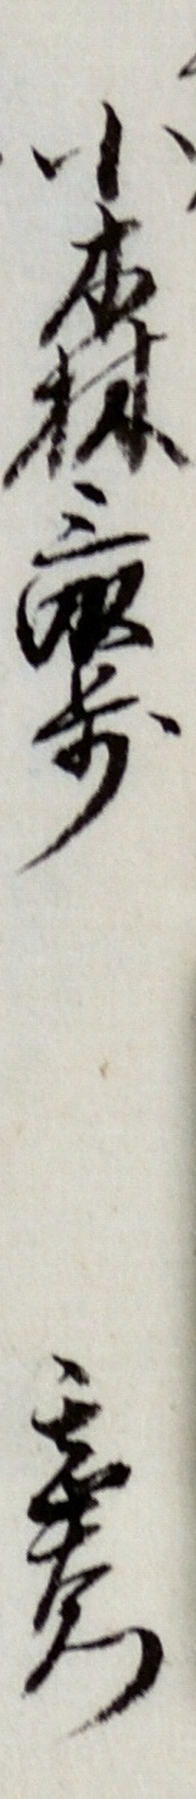小木林三畝歩甚右衛門
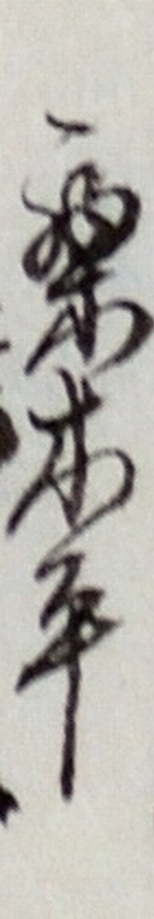栗木平
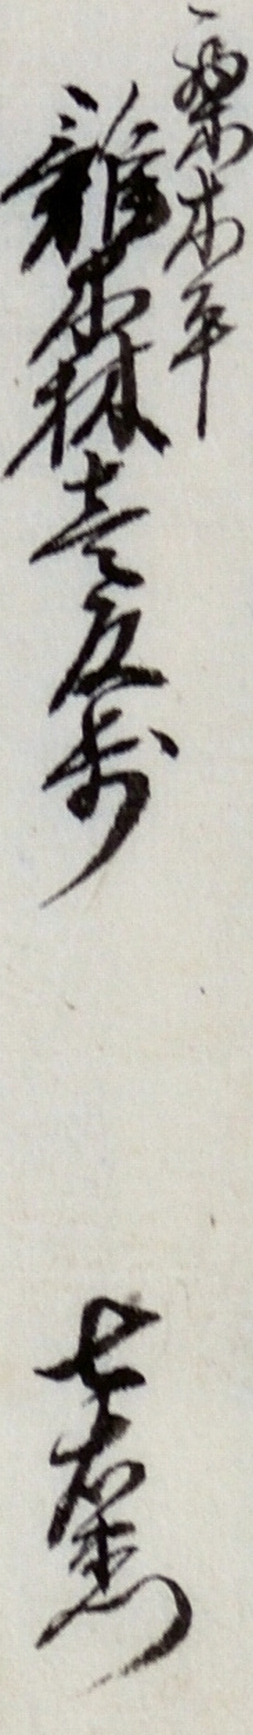雑木林壱反歩七右衛門
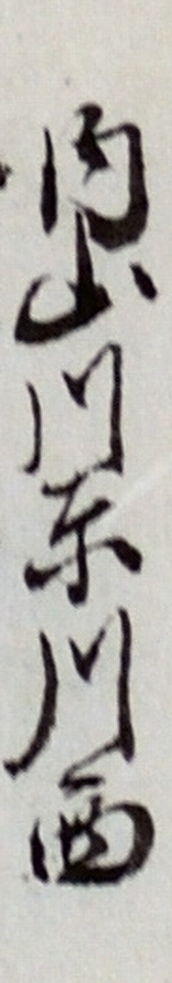内山川東川西
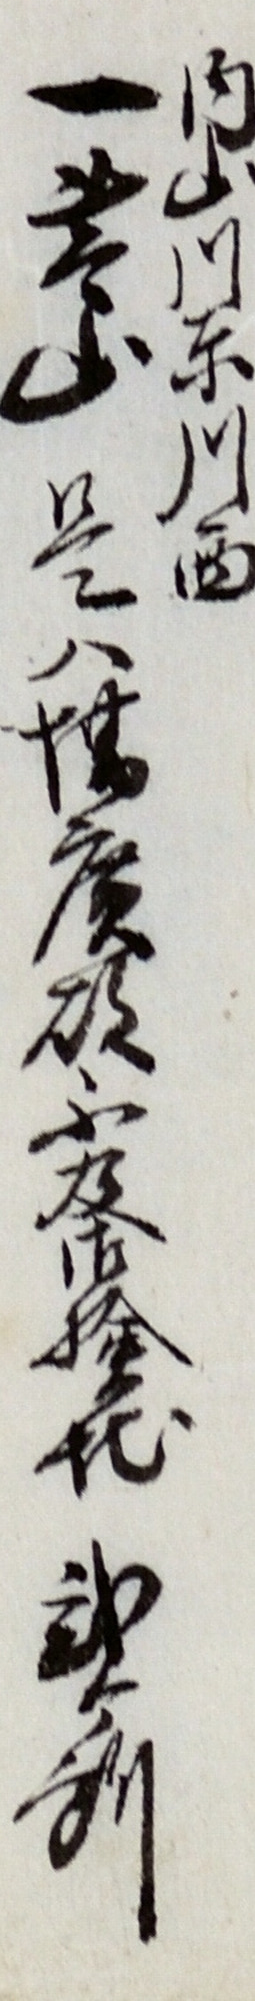一芝山是ハ場広故不及御検地弐ヶ所
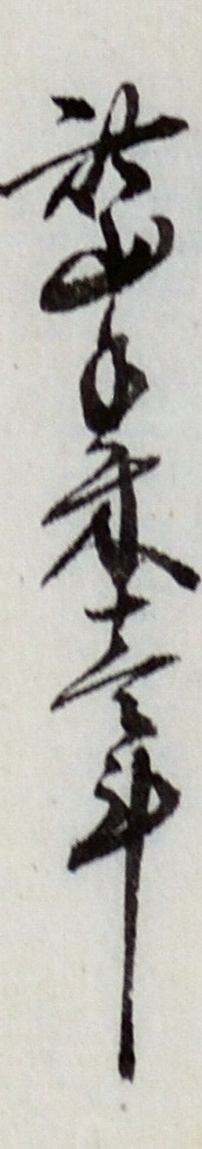此山手米壱斗
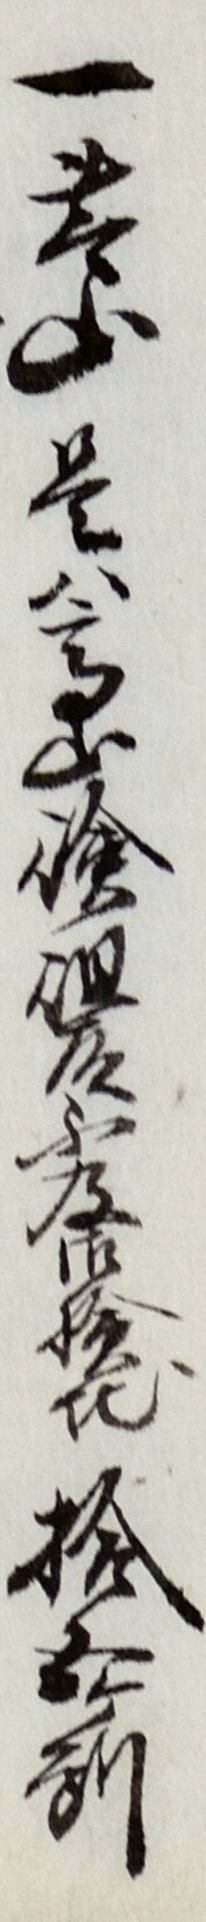一芝山是ハ高山嶮阻故不及御検地拾五ヶ所
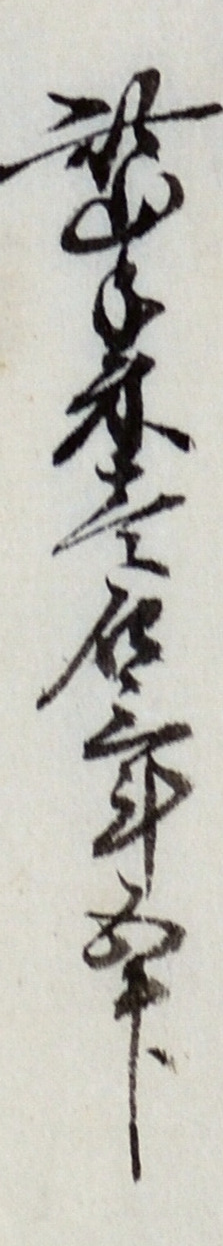此山手米壱石三斗五升
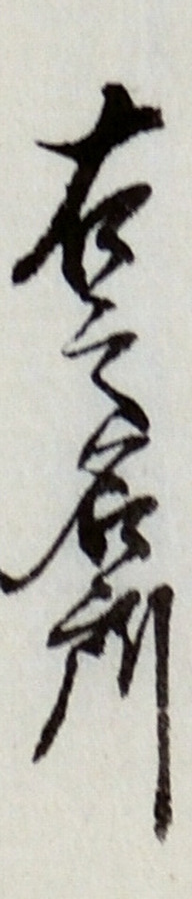右之名所
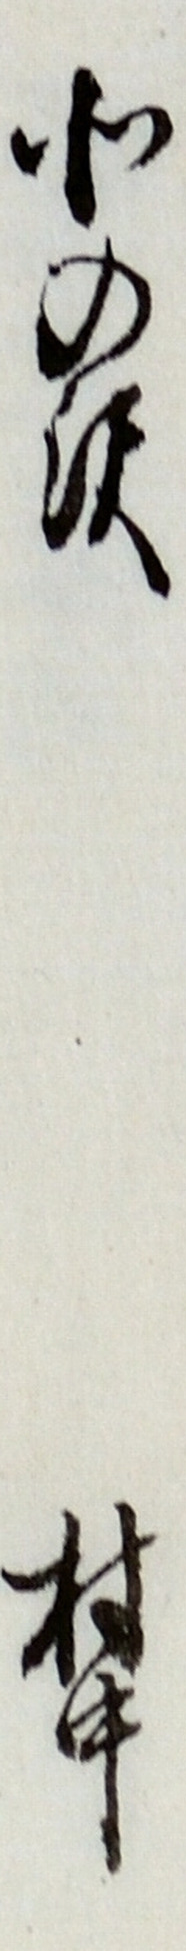北の沢村中
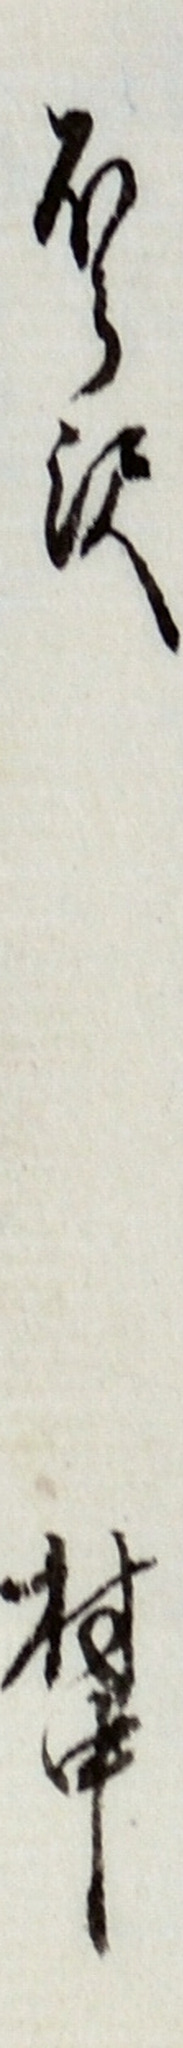ほら沢村中
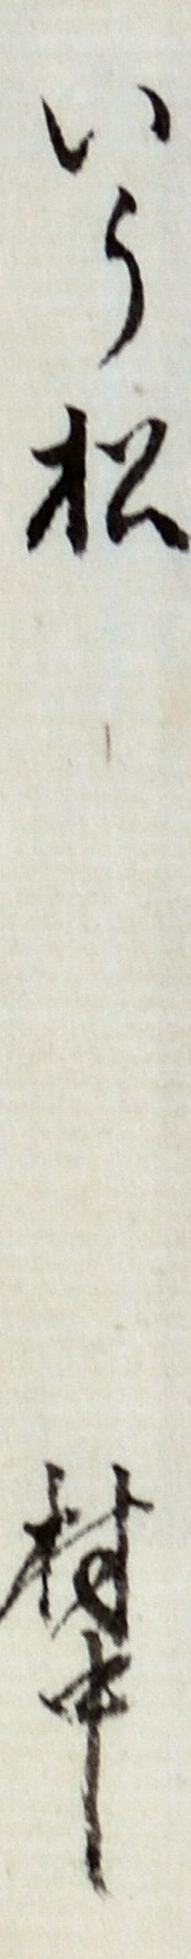いう松村中
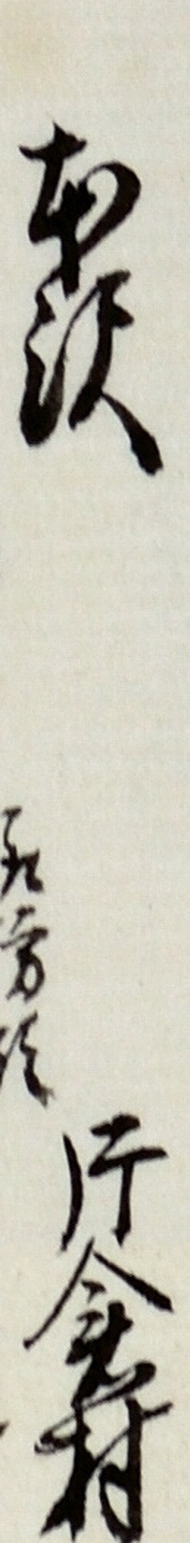本沢片倉村
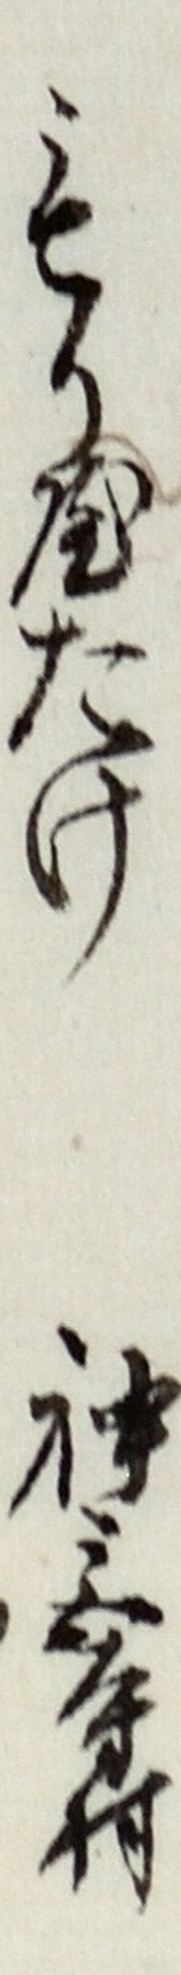もりやたけ神宮寺村
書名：御領分中山林社地手控
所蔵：伊那市立高遠町図書館・合同会社AMANE
